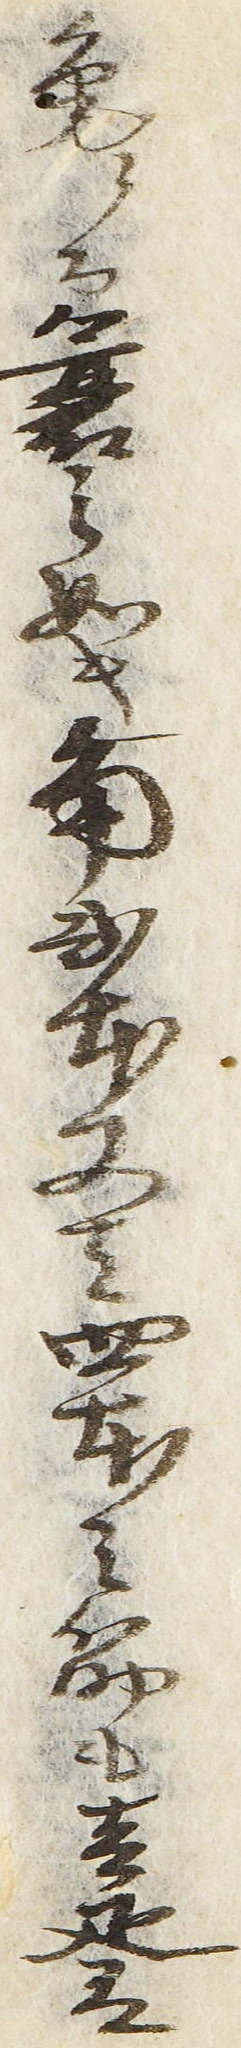色ニ而鹿之如キ角弐本又者四本之筋も壱疋有
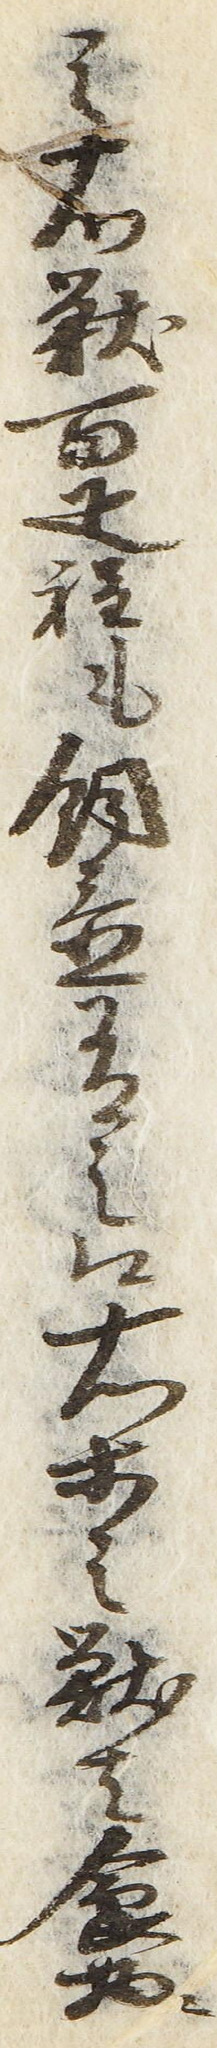之右獣百疋程も飼置有之候右等之獣者食物ニ
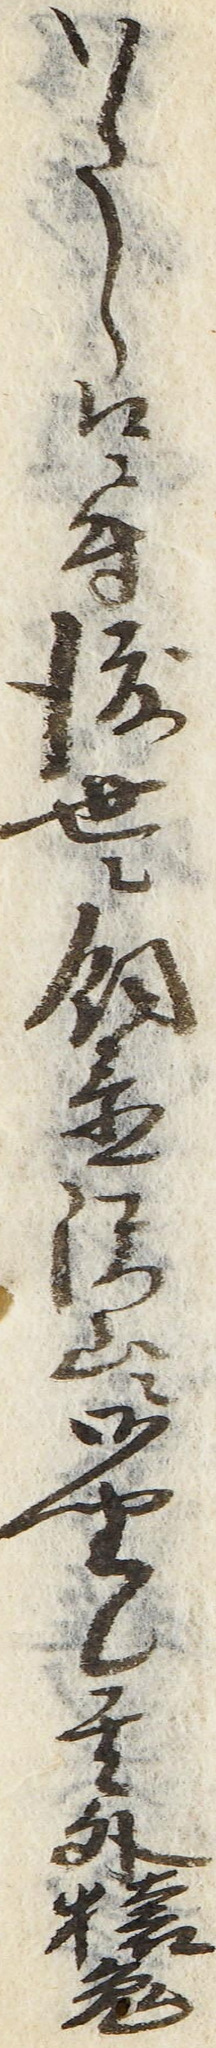いたし候ニ付後世ニ飼置沢山ニ御座候其外猿兎

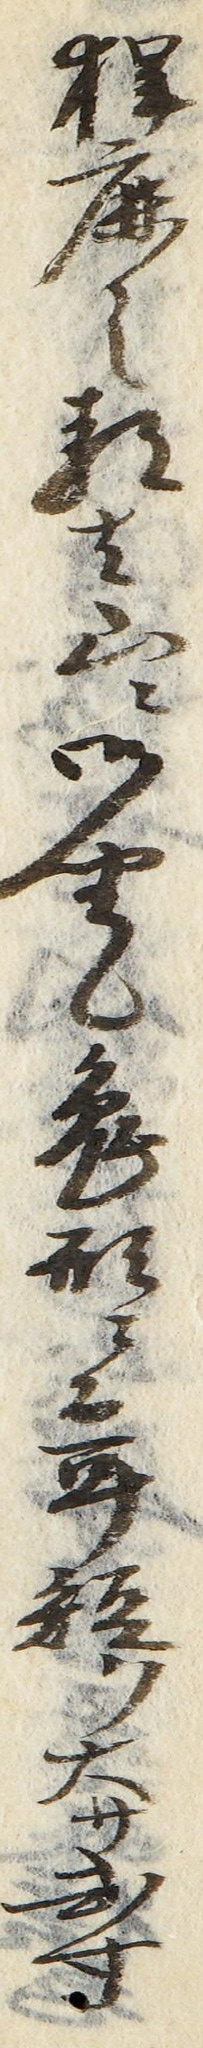狸鹿之類者山ニ御座候兎形ニ而耳短ク大サ弐寸
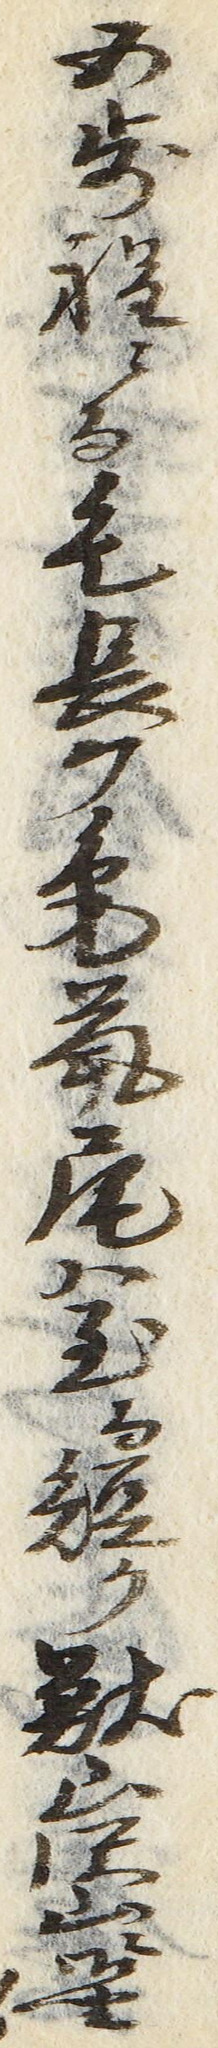五歩程ニ而毛長ク色鼠尾ハ至而短ク獣山沢山ニ御座候
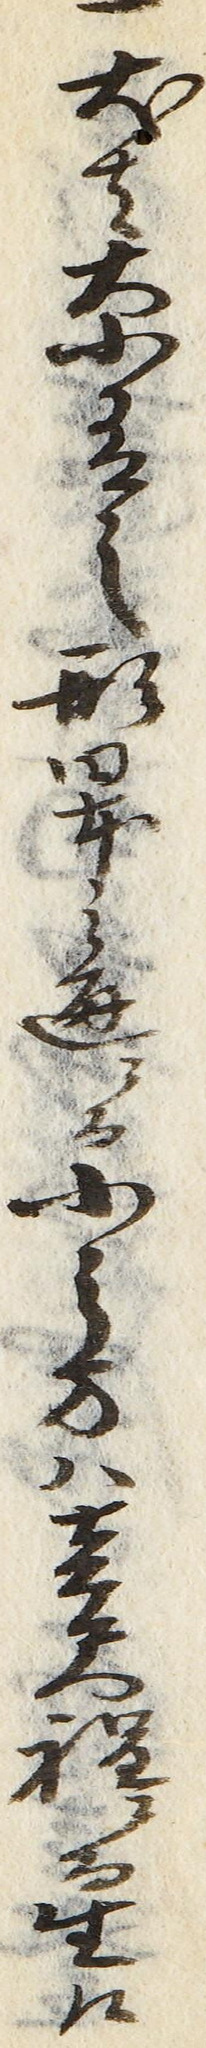一犬者大小有之形日本之通ニ而小之方ハ壱尺程ニ而生候
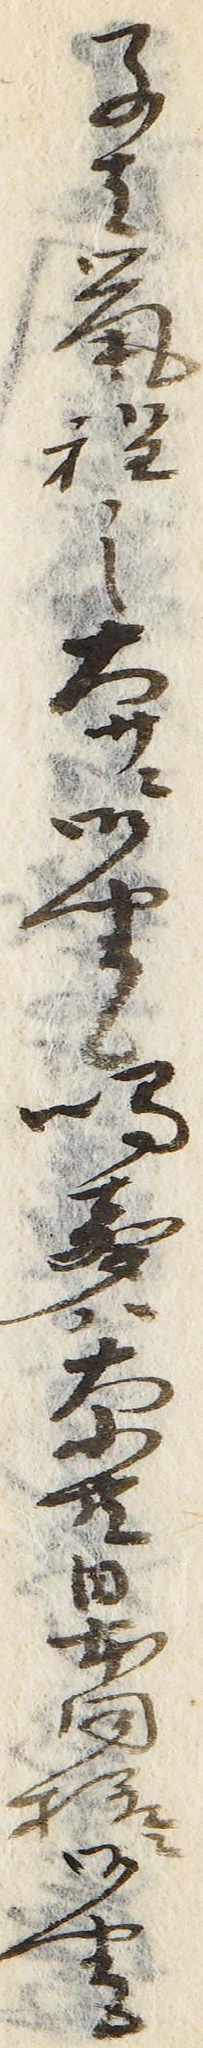子者鼠程之大サニ御座候鳴聲ハ大小共日本同様ニ御座候
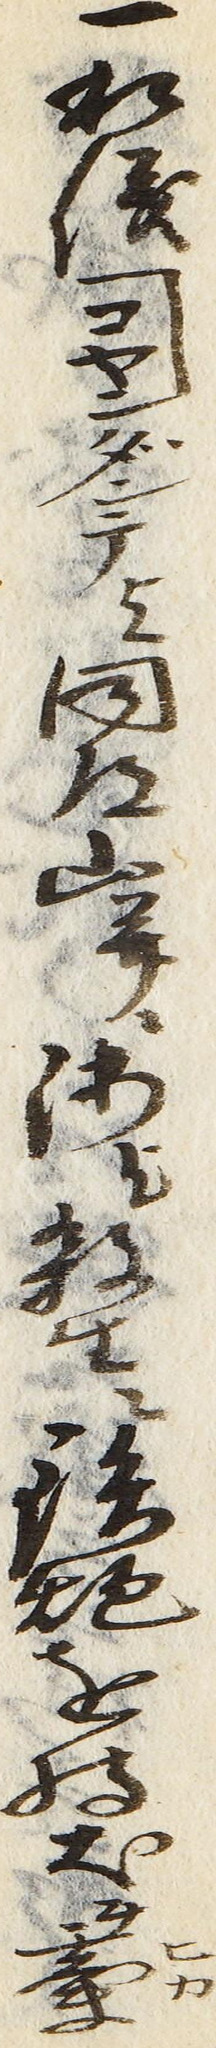一私儀「コヤンダンテと同道山幷海江殺生ニ鉄炮を持犬ヲ牽
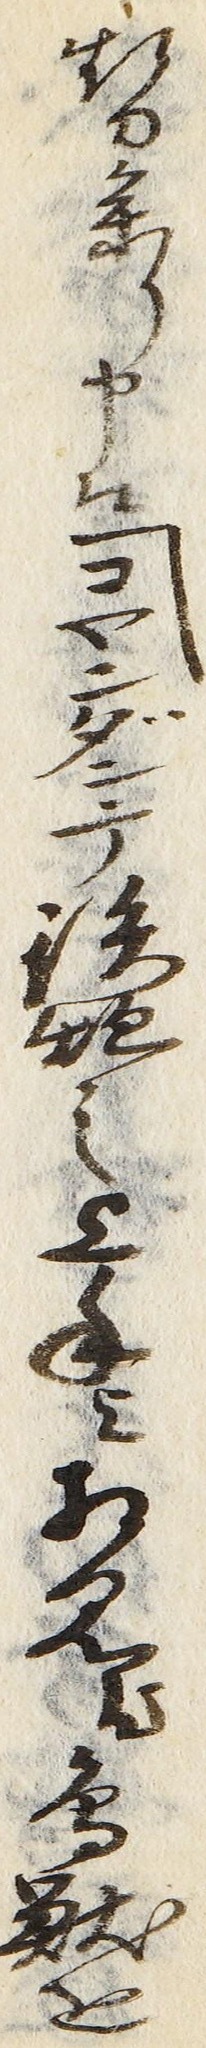せ参り申候「コヤンダンテ鉄炮之上手と相見江鳥獣を
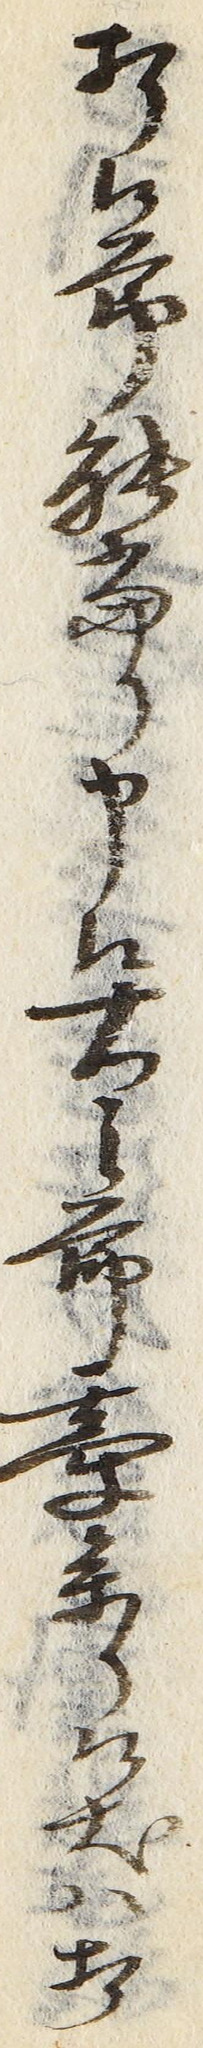打候節能當り申候右之節牽参り候犬ハ打
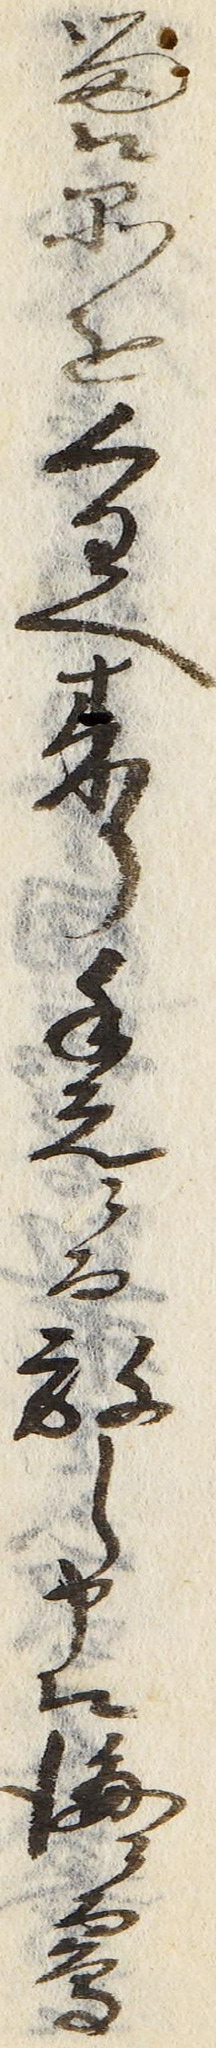留候品をくわへ來り手元ニ而放し申候海ニ而鳥
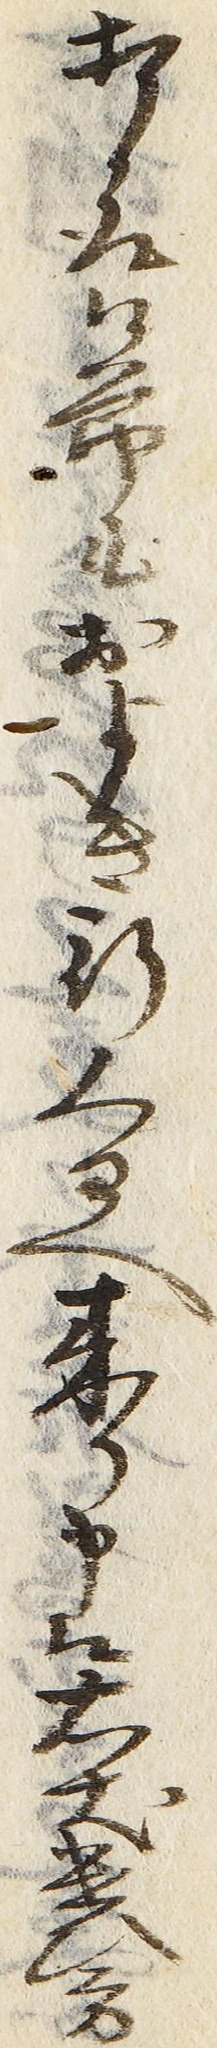打取候節もおよき行くわへ來り申候右犬遣ひ方
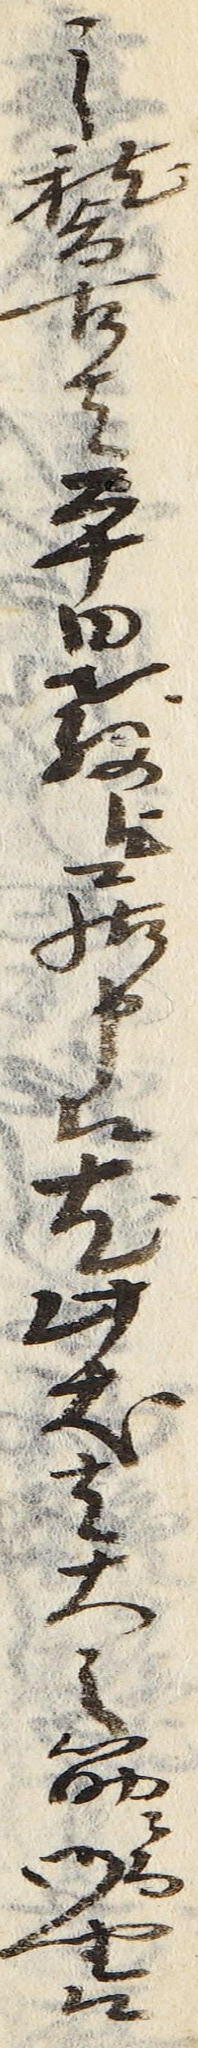之稽古者平日教江居申候尤此犬者大之筋ニ而御座候
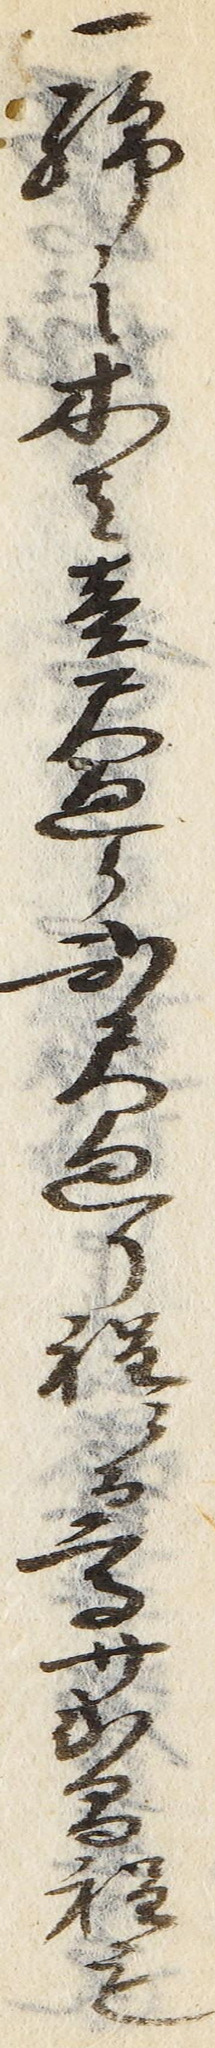一綿之木者壱尺廻り弐尺廻り程ニ而高サ弐間程も
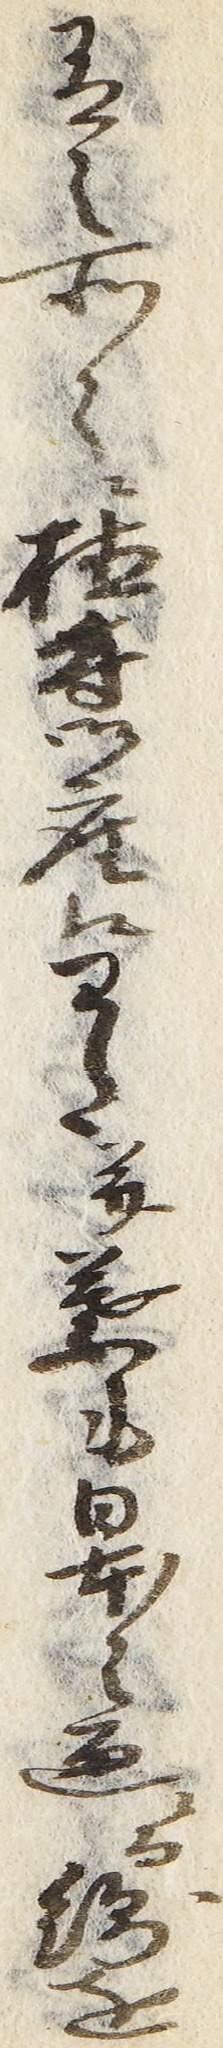有之所々ニ植付御座候わた幷葉も日本之通ニ而綿を
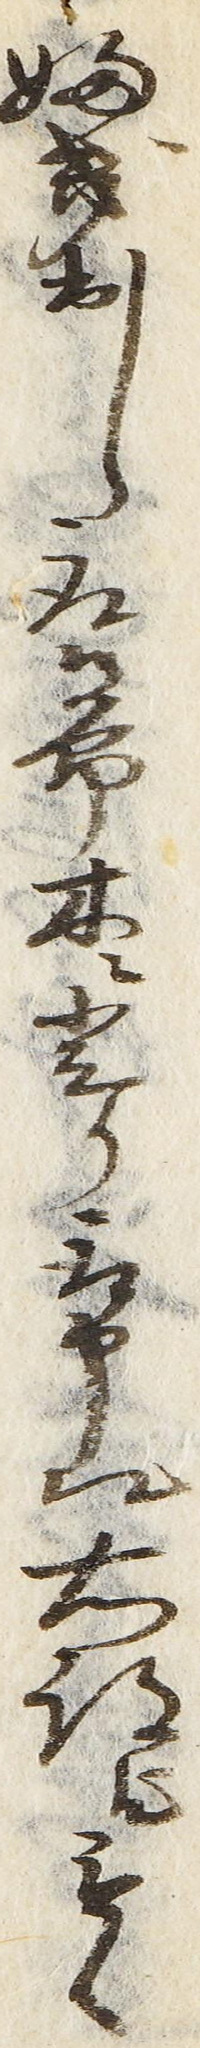ふき出し取候節木ニ登り取申候右跡江もく
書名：漂流人善助聞書
